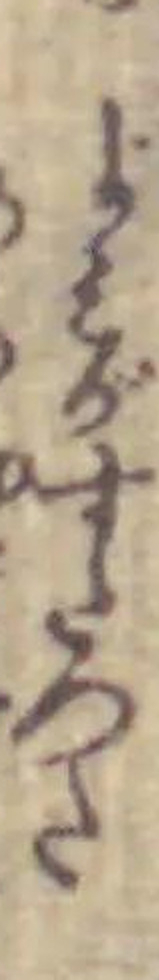よみがすたつた
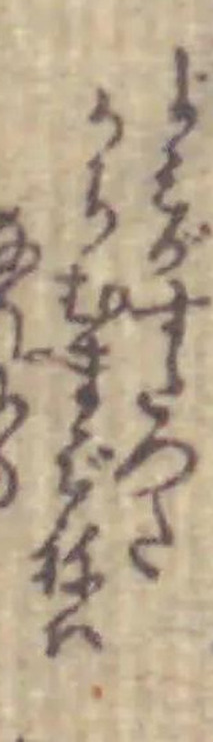からむまねは
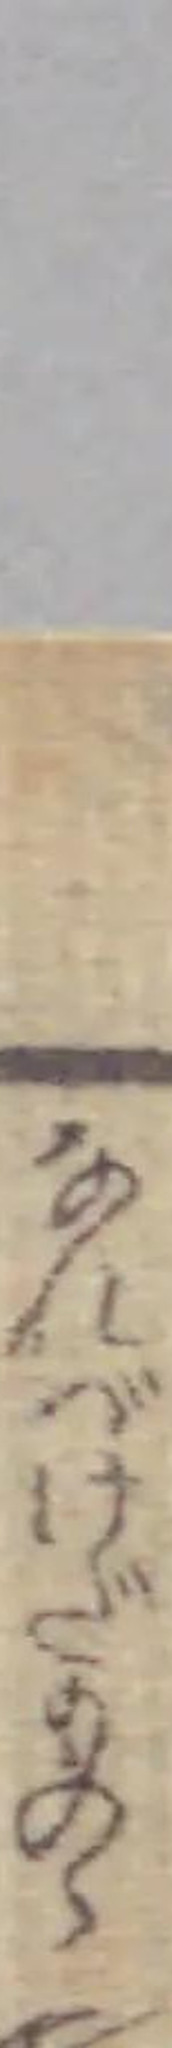なればけだものゝ
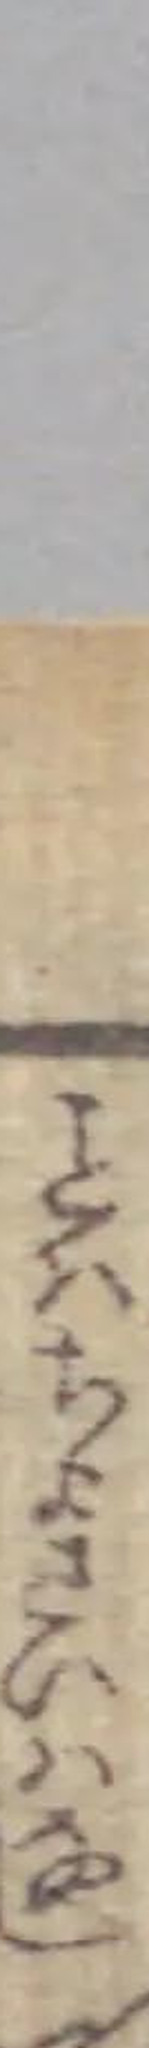ことはちよさいはなし
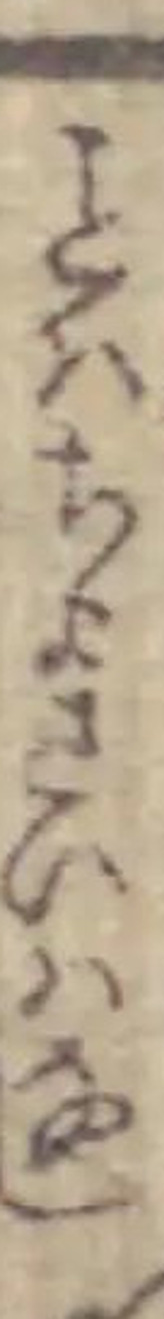ことはちよさいはなし
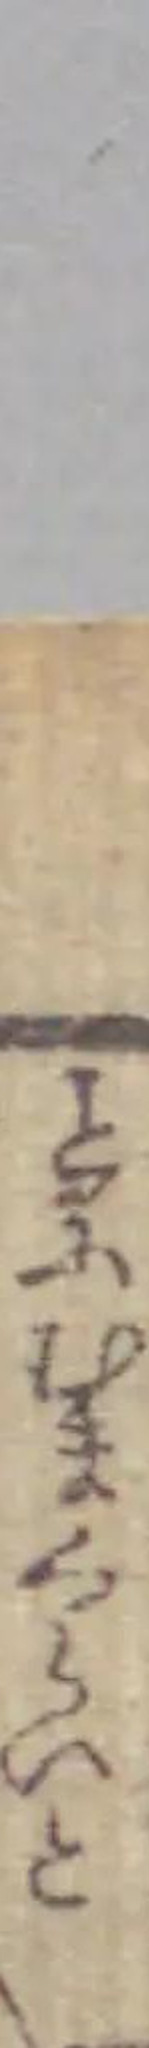ことにむまくらいと
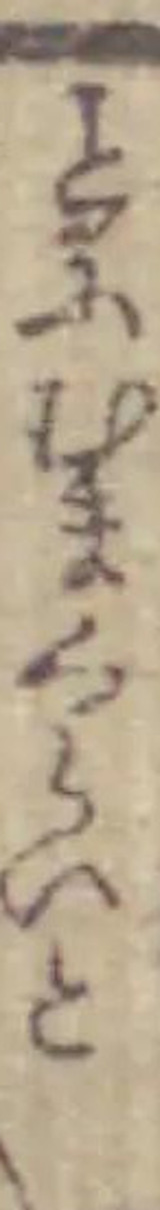ことにむまくらいと
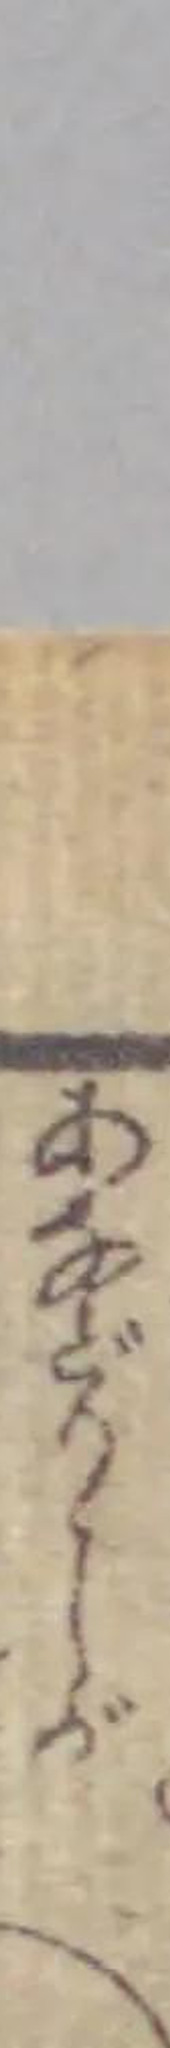あなどりしが
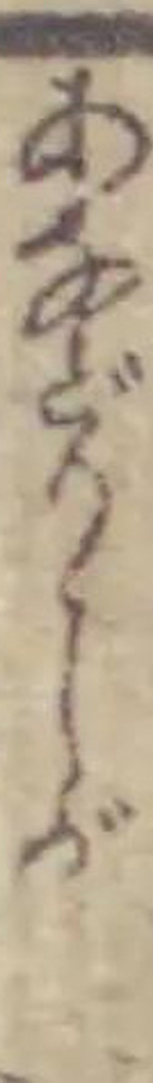あなどりしが
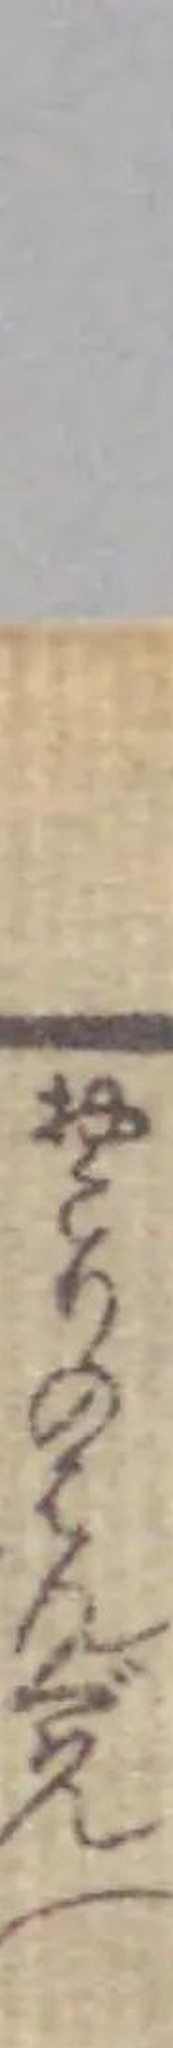おこものはんぐはん
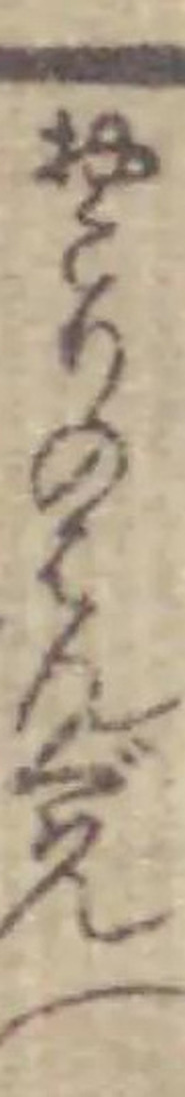おこものはんぐはん
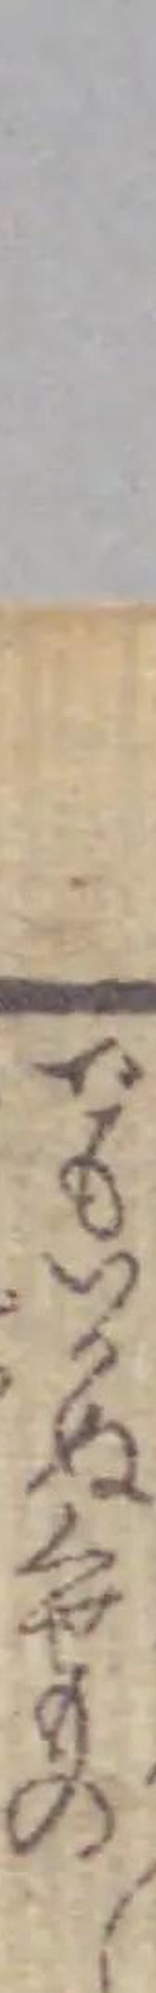でもいかぬくせもの
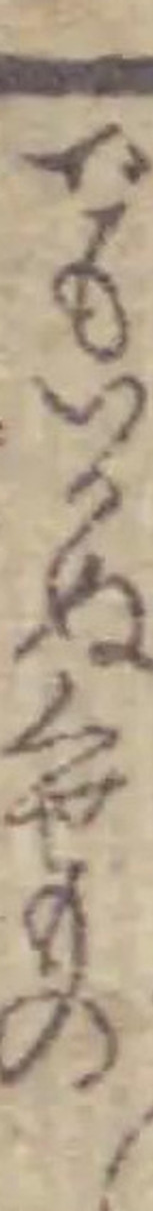でもいかぬくせもの
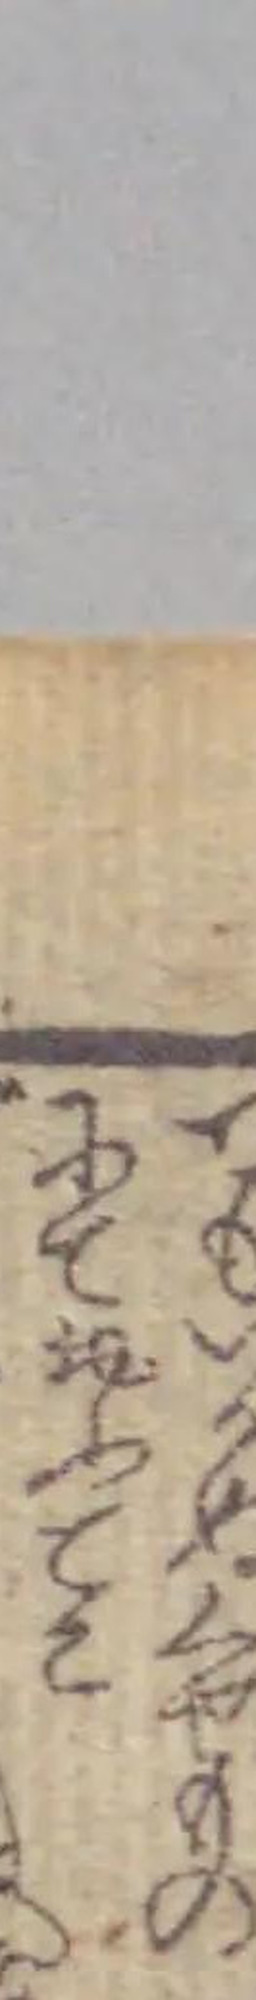にておふてこ
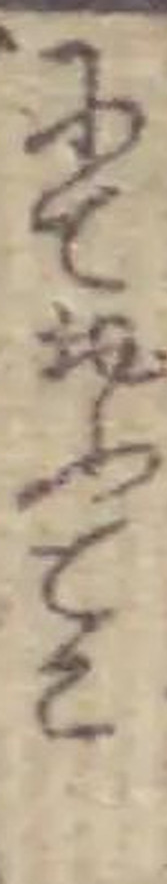にておふてこ
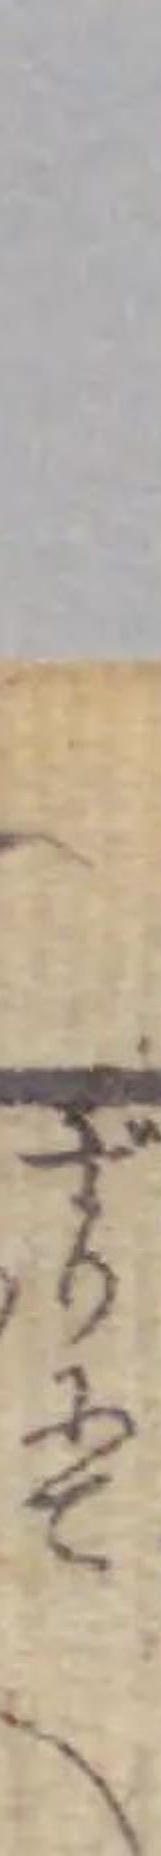ずりにて
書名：もふもふもふ怖噺 2巻
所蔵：国立国会図書館 National Diet Library, JAPAN
